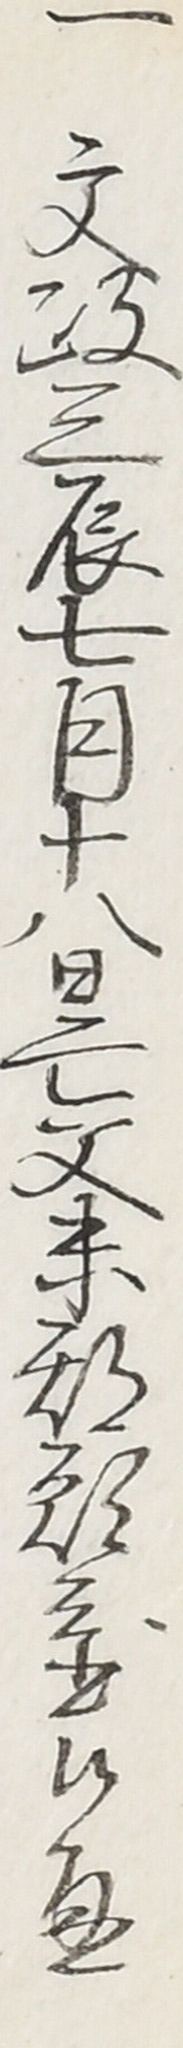一文政三辰七月十八日亡父末期願置候通
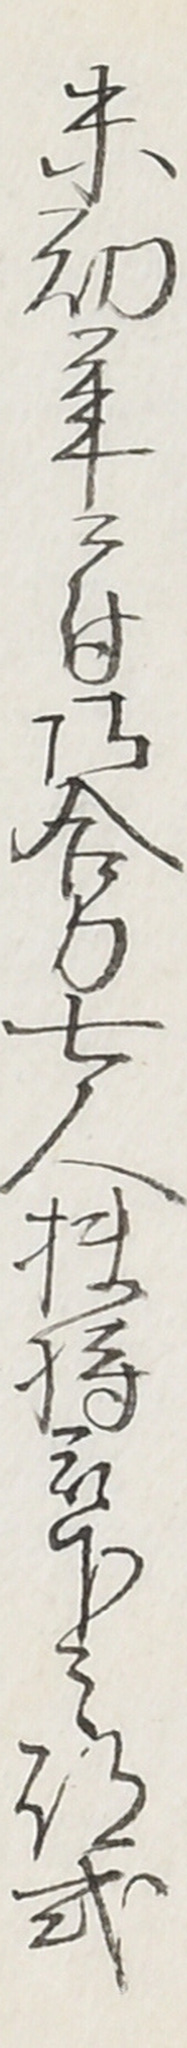未幼年ニ付御合力七人扶持被下之跡式
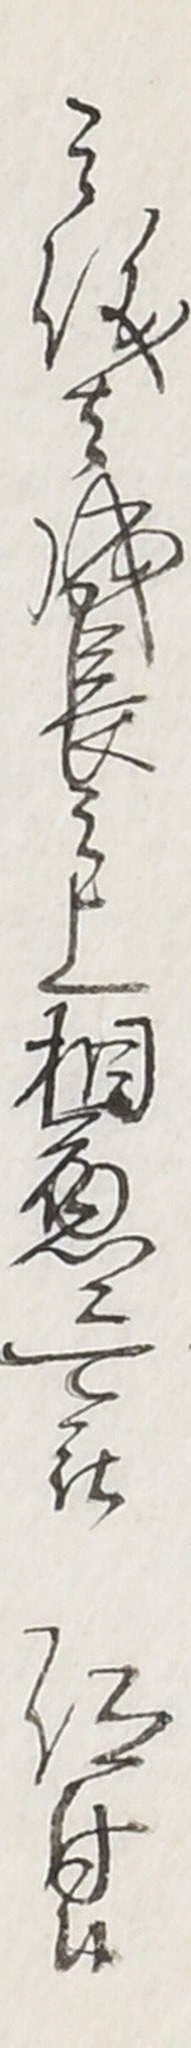之儀は成長之上相応ニ可被仰付候
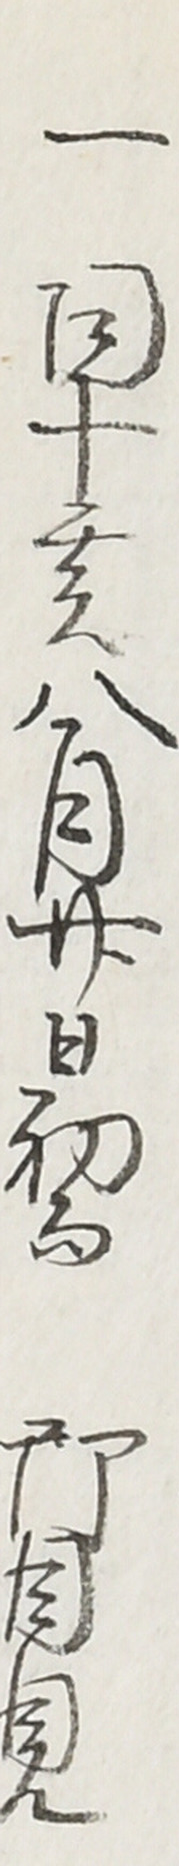一同十亥八月廿日初而御目見
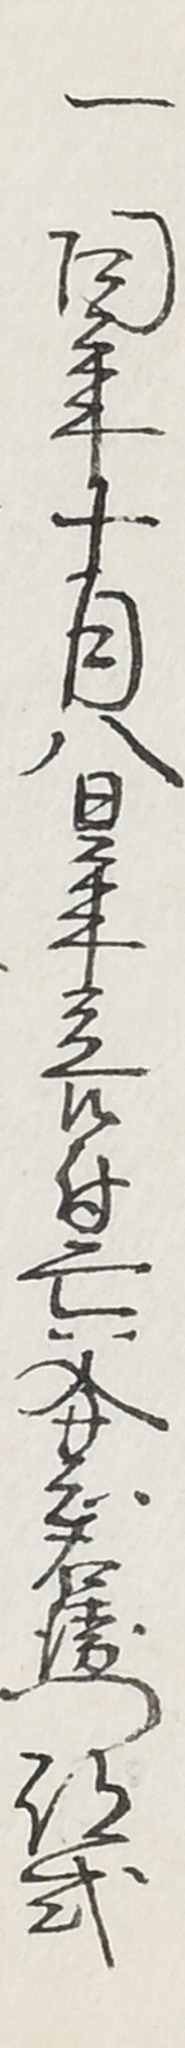一同年十月八日年立候付亡父甚右衛門跡式
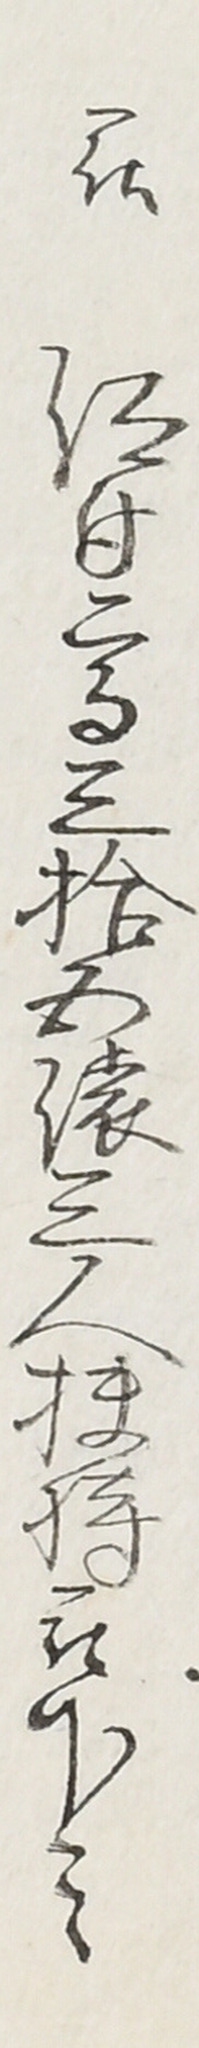被仰付高三拾五俵三人扶持被下之
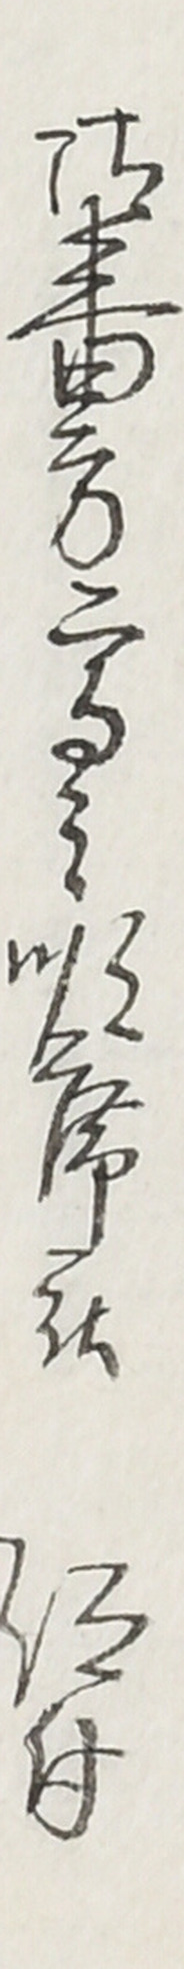御番方高之順席被仰付
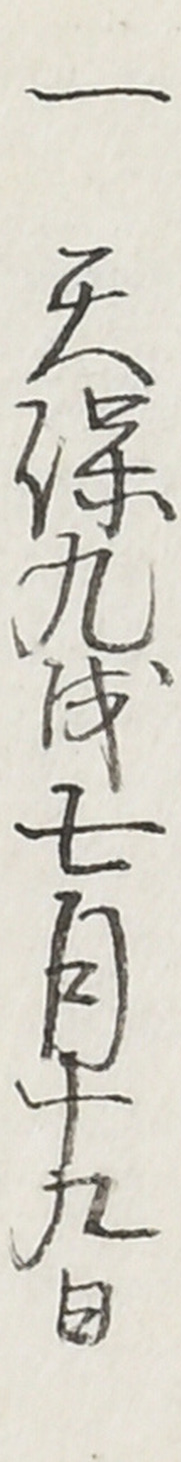一天保九戌七月十九日
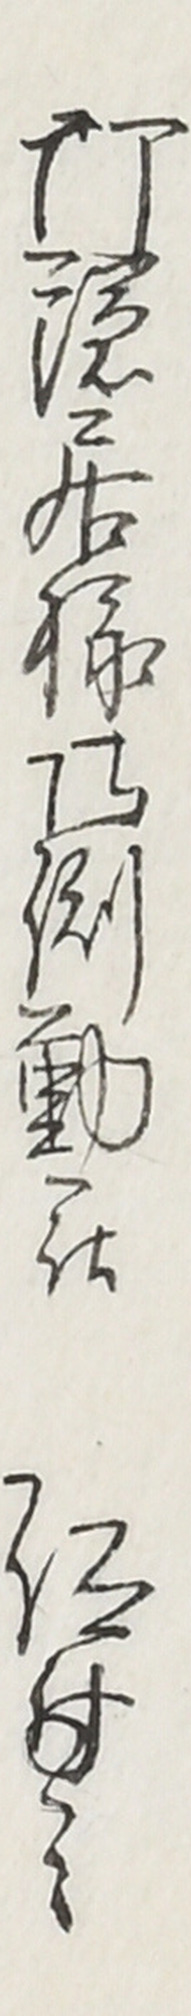御隠居様御側勤被仰付之
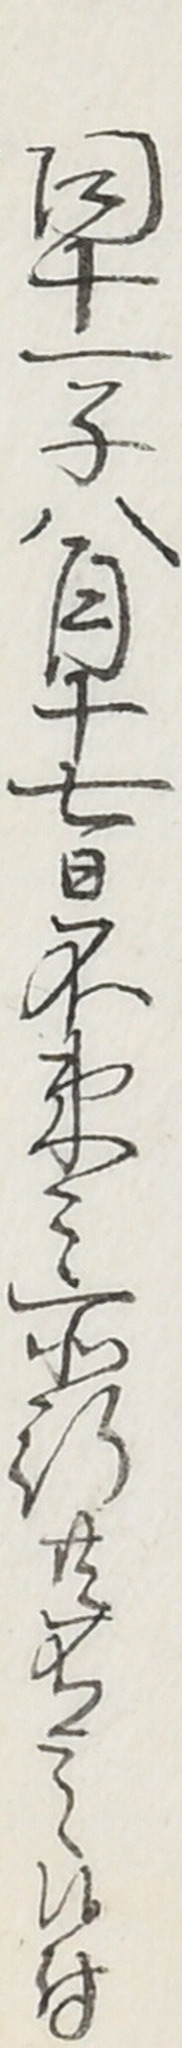一同十一子八月十七日不束之所行共有之候付
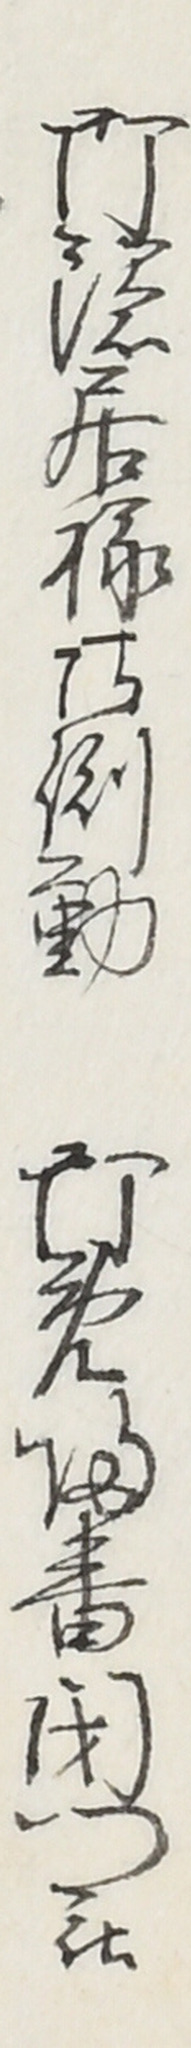御隠居様御側勤御免帰番閉門被
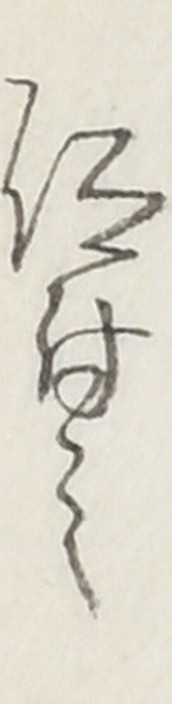仰付之

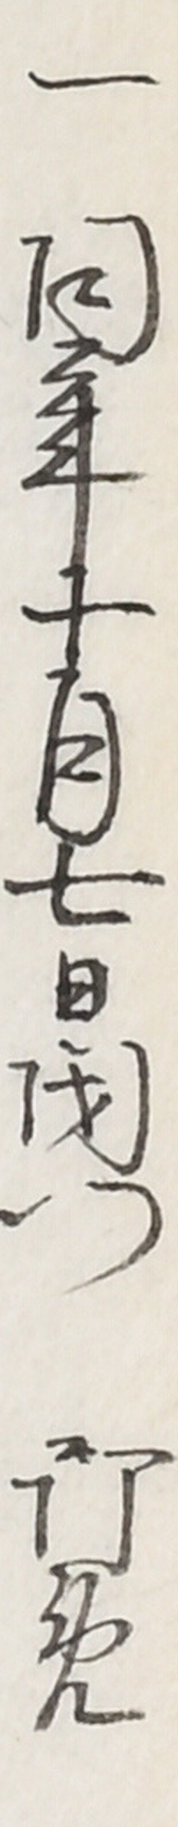一同年十月七日閉門御免
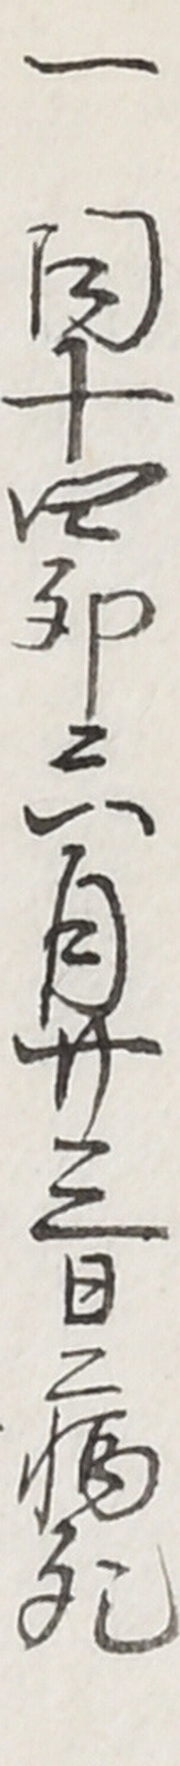一同十四卯六月廿三日病死
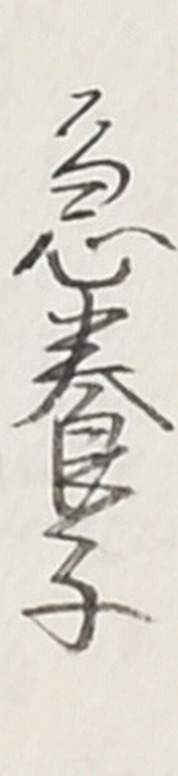急養子
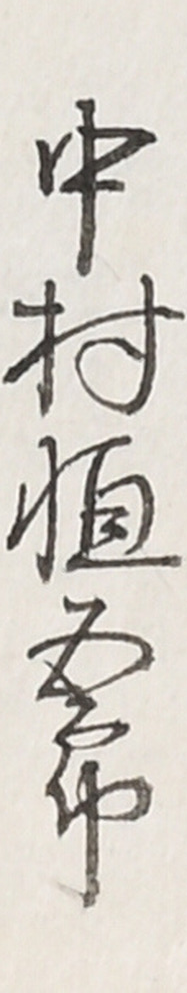中村恒五郎
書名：給人諸士勤仕録（七）
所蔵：伊那市立高遠町図書館・合同会社AMANE
